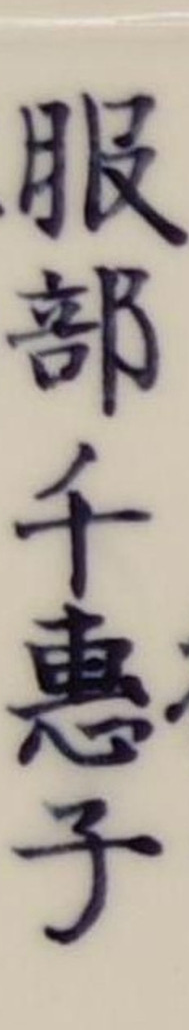服部千恵子
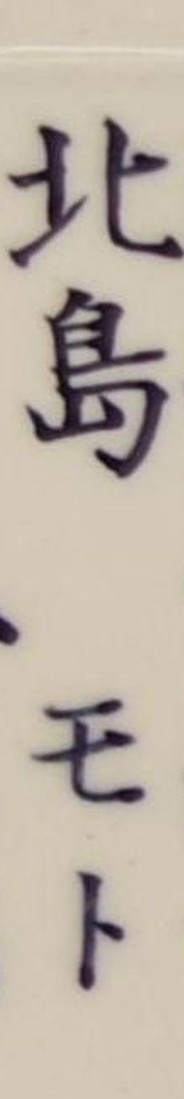北島モト
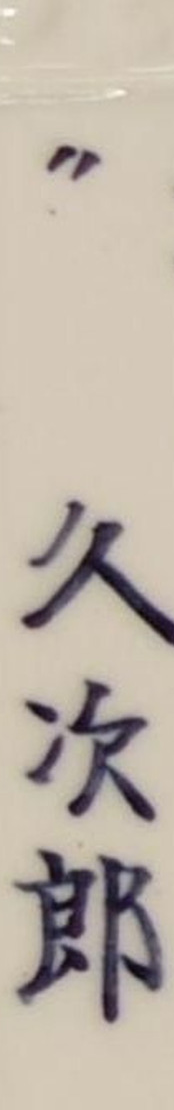久次郎
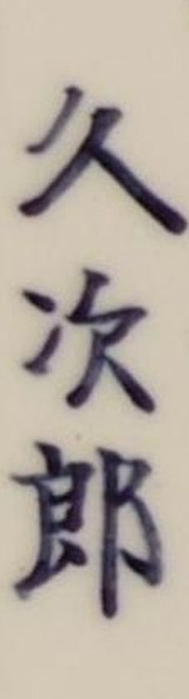久次郎

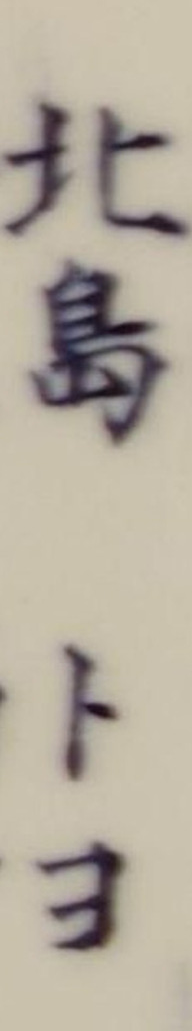北島トヨ
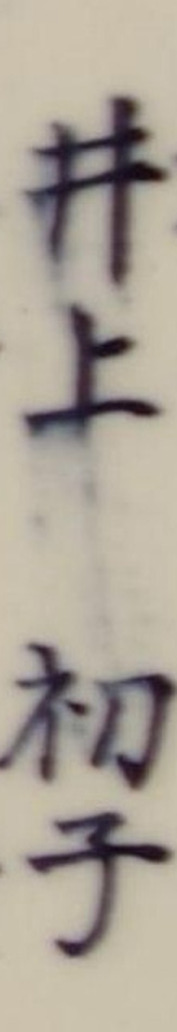井上初子
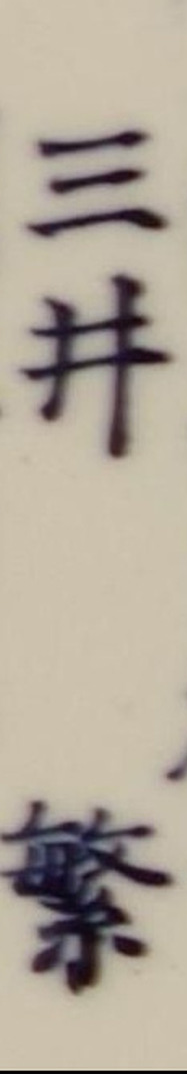三井繁
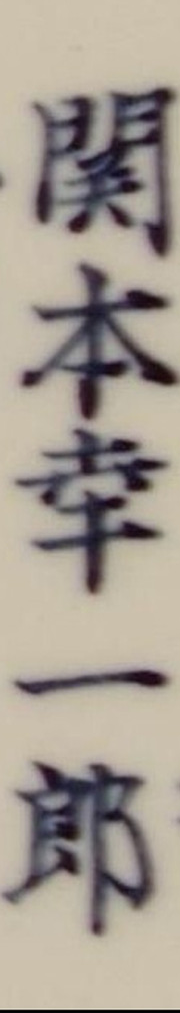関本幸一郎
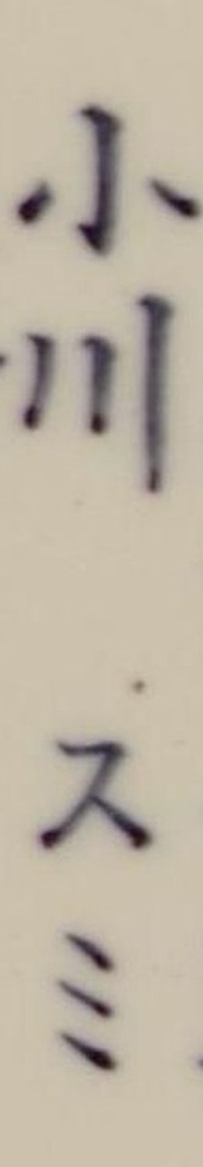小川スミ
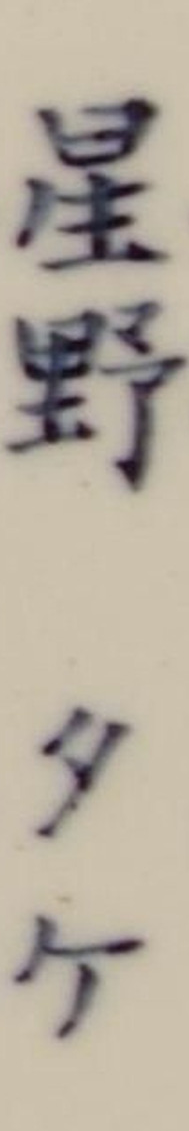星野夕ケ
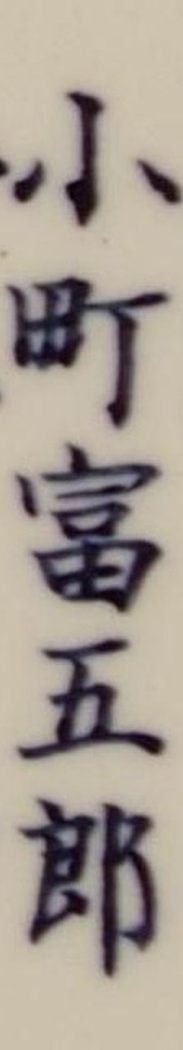小町富五郎
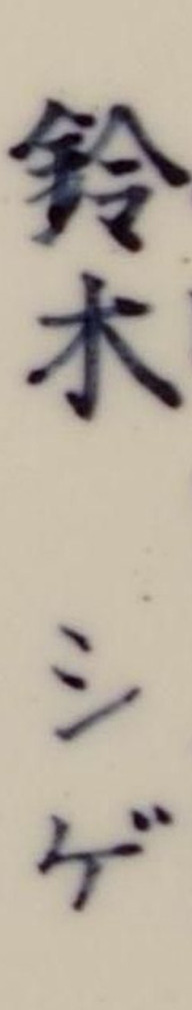鈴木シゲ
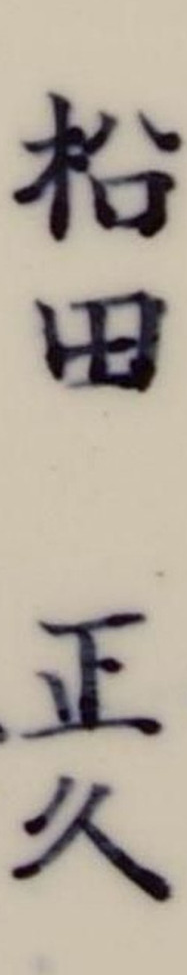松田正久
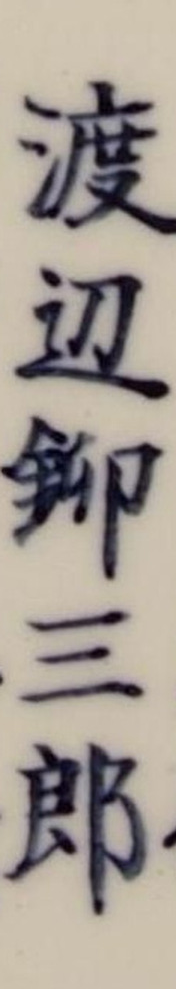渡辺鉚三郎
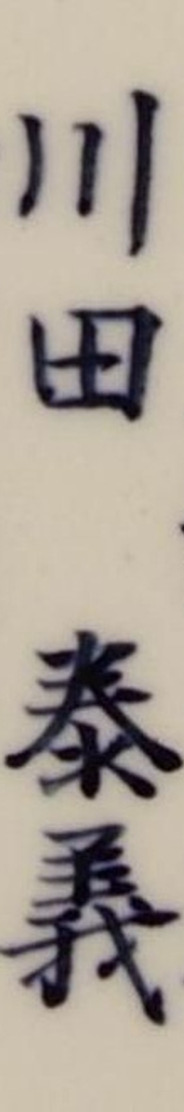川田泰義
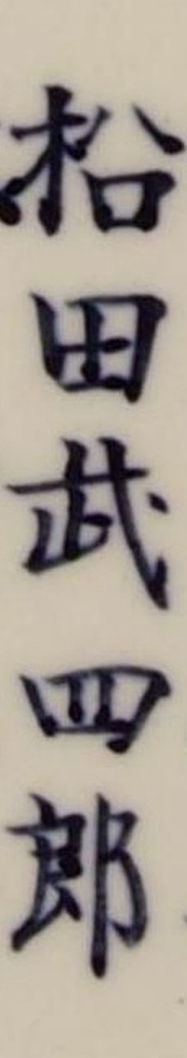松田武四郎
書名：M~S
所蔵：高野山金剛峯寺
